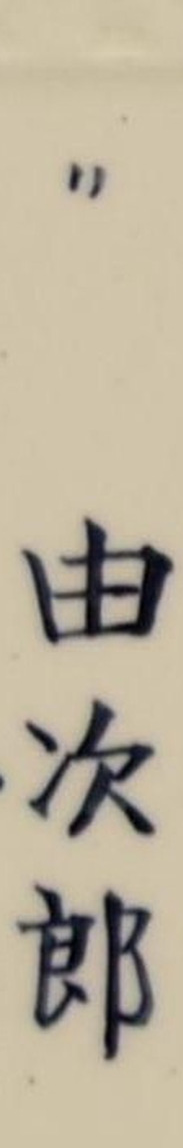由次郎
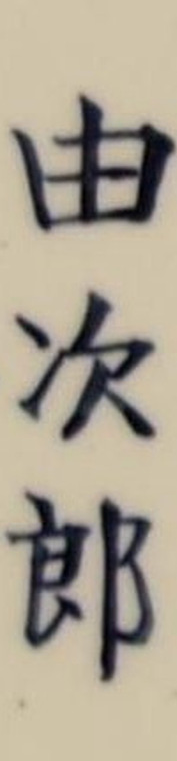由次郎
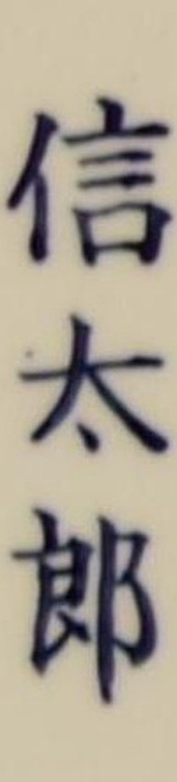信太郎
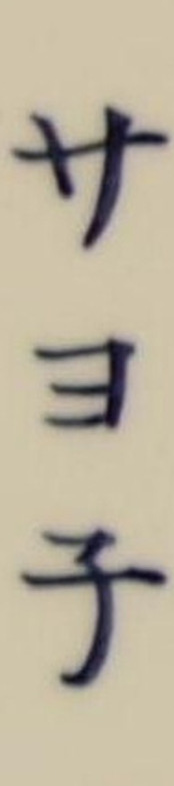サヨ子

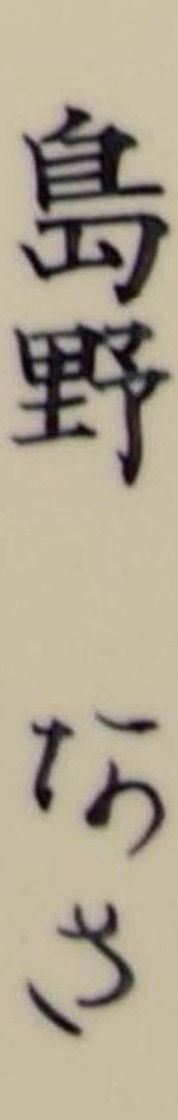島野あさ
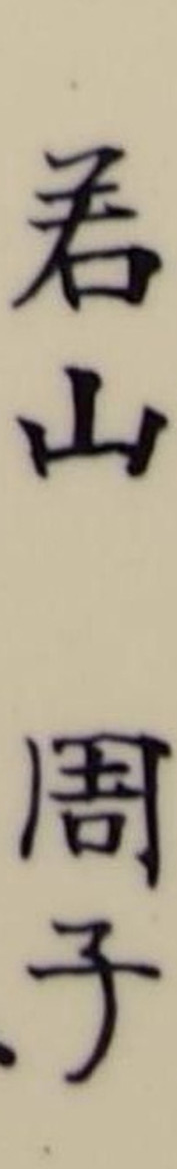若山周子
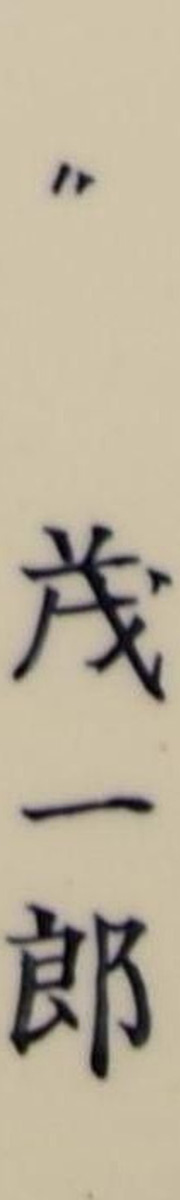茂一郎
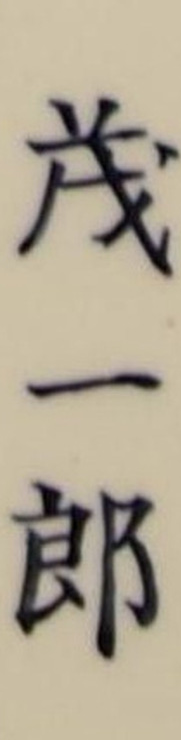茂一郎
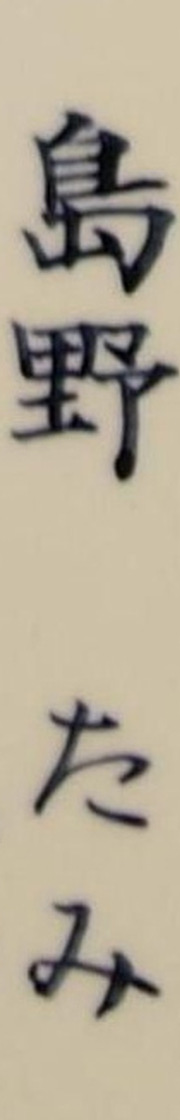島野たみ
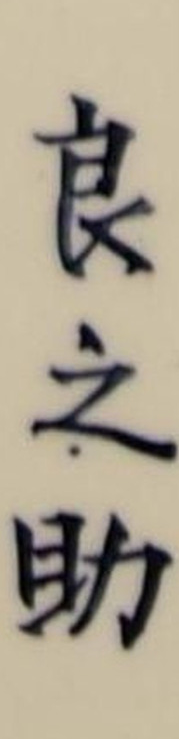良之助
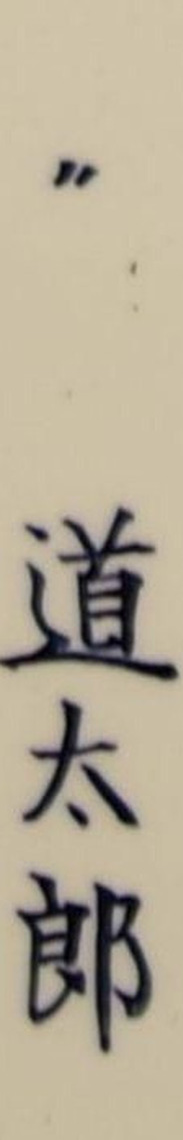道太郎
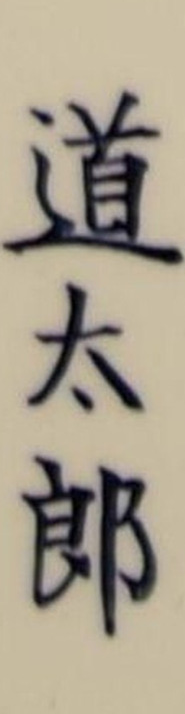道太郎
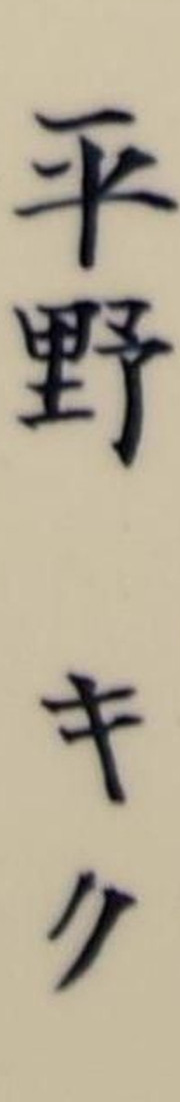平野キク
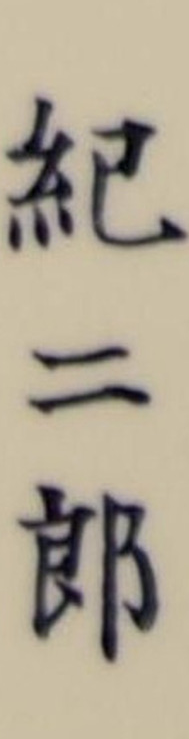紀二郎
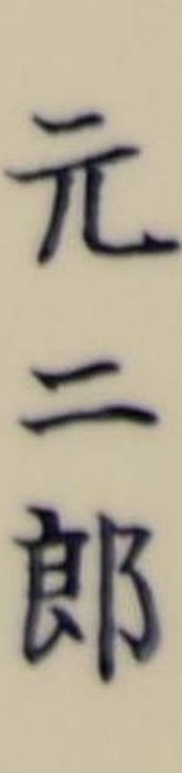元二郎
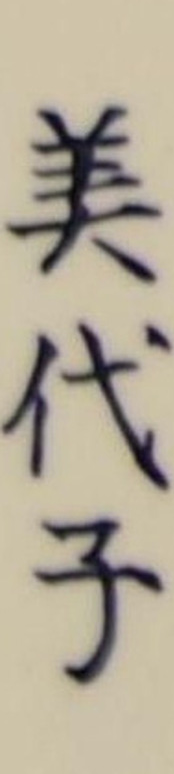美代子
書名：A~D
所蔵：koyasan kongobuji
